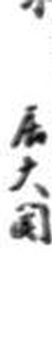居大関
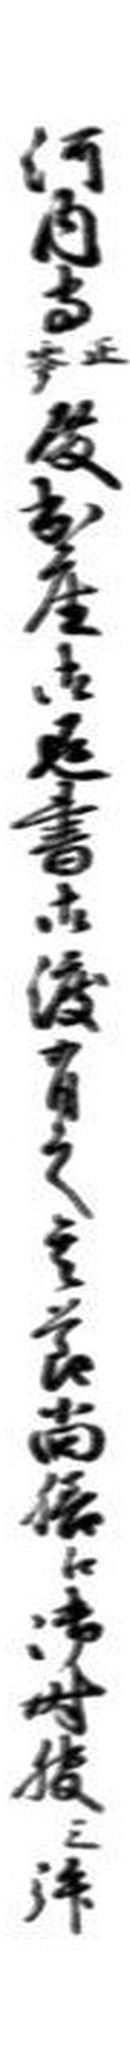岑殿出座御返書御渡有之其節尚膳江御時服三拝
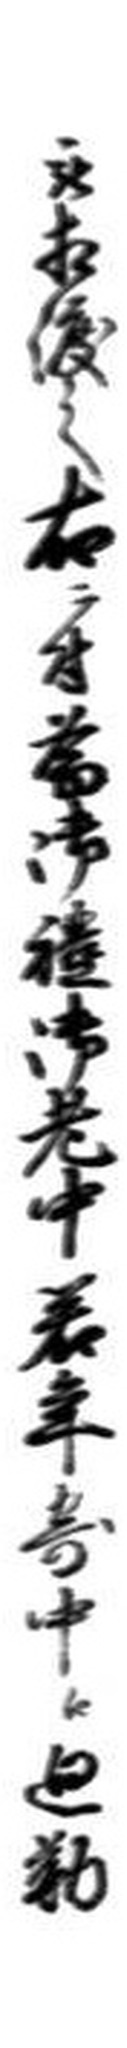被相渡之右ニ付為御礼御老中若年寄中江廻勤
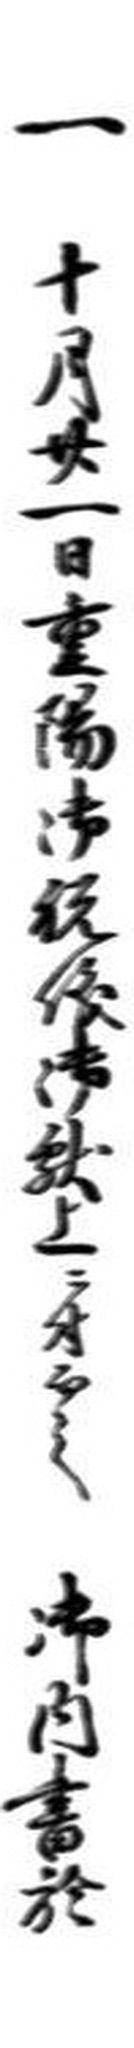一十月廿一日重陽御祝儀御献上ニ付而之御内書於

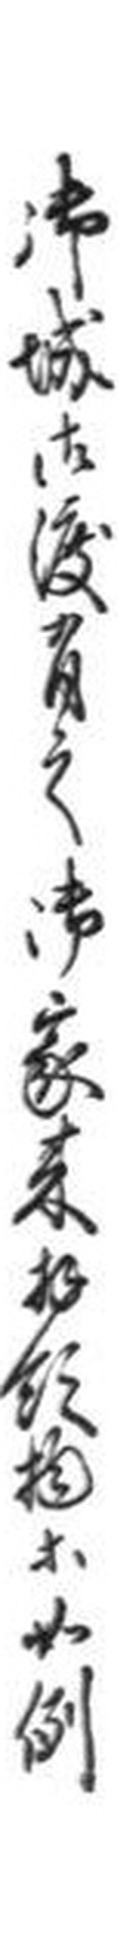御城御渡有之御家来拝領物等如例
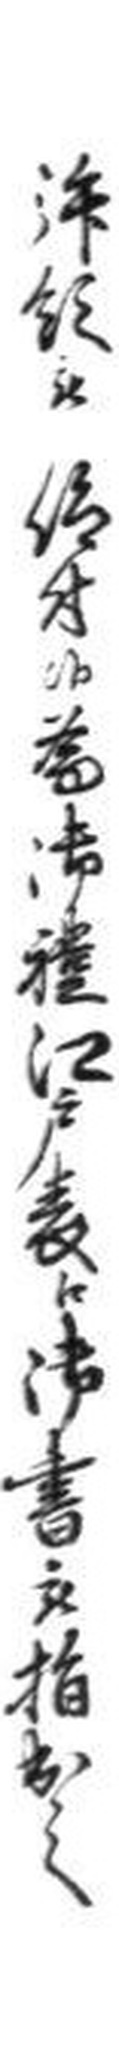拝領被仰付候為御礼江戸表江御書被指出之
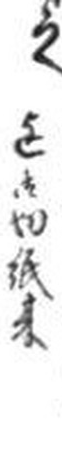迄御切紙来
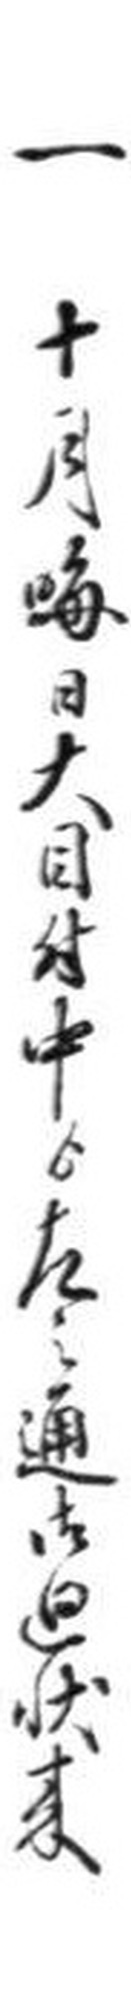一十月晦日大目付中ゟ左之通御廻状来
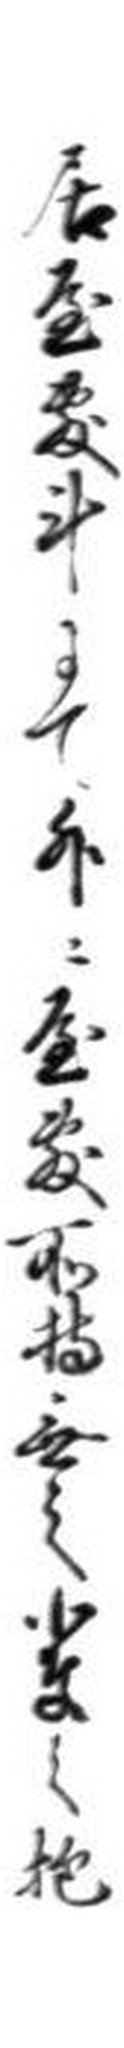居屋敷斗にて外ニ屋敷所持無之輩之抱
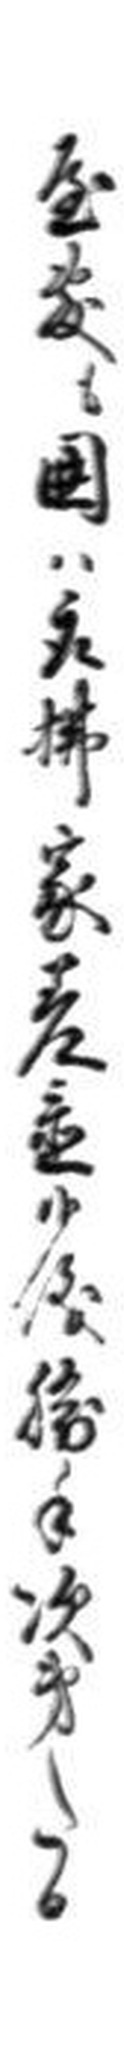屋敷も囲ハ取払家差置候儀勝手次第たる
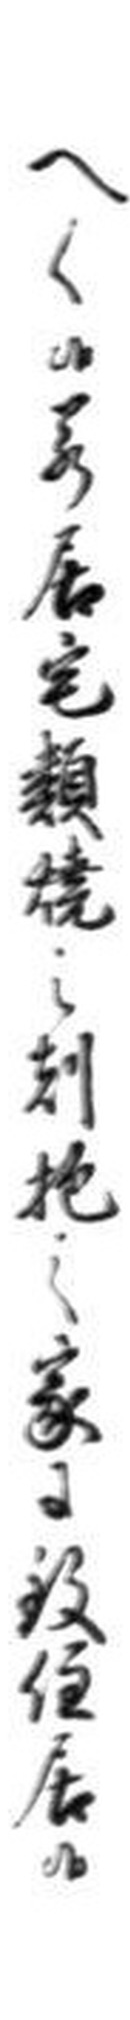へく候若居宅類焼之刻抱之家に致住居候
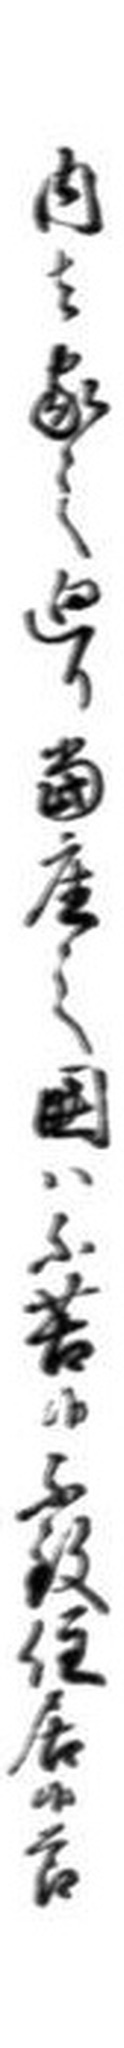内者家之廻り当座之囲ハ不苦候不致住居候節
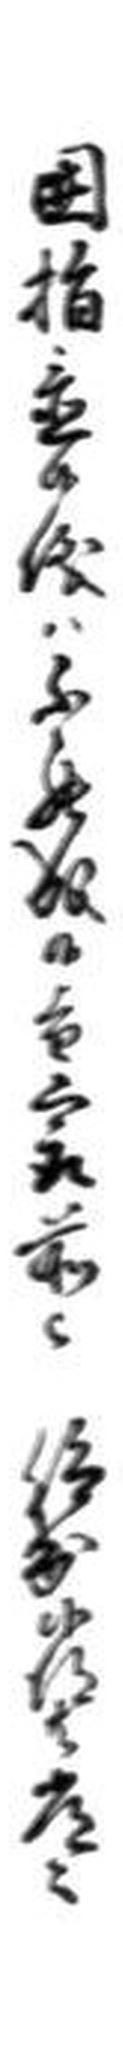囲指置候儀ハ不罷成候旨最前被仰出候得共常々
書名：家譜 三十二 吉邦公 従享保二年到享保三年
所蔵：福井県文書館 Fukui Prefectural Archives
